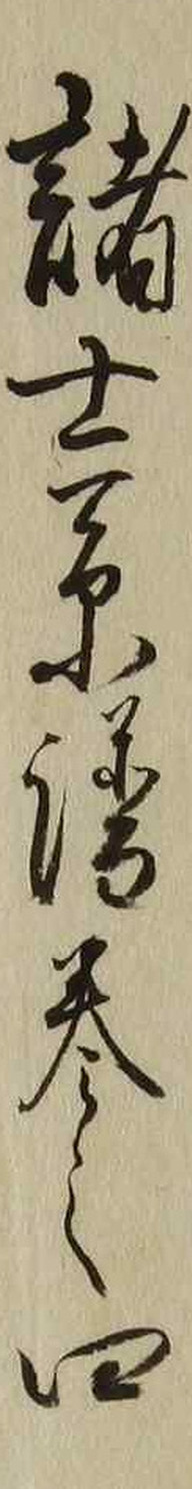諸士系譜巻之四
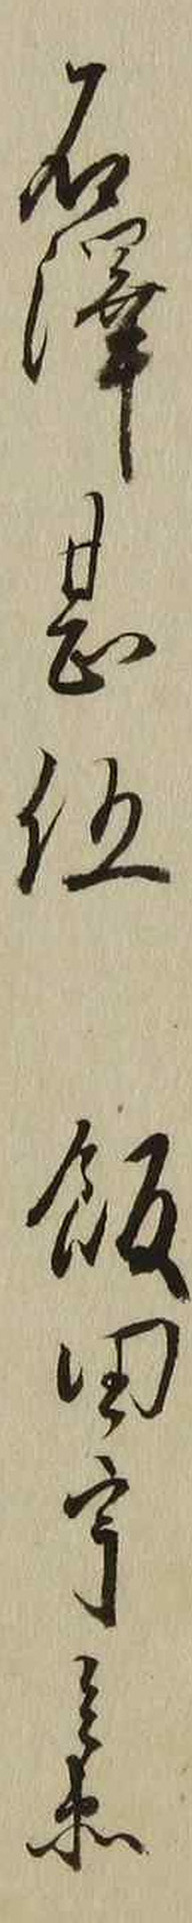石澤甚伍飯田宇兵衛
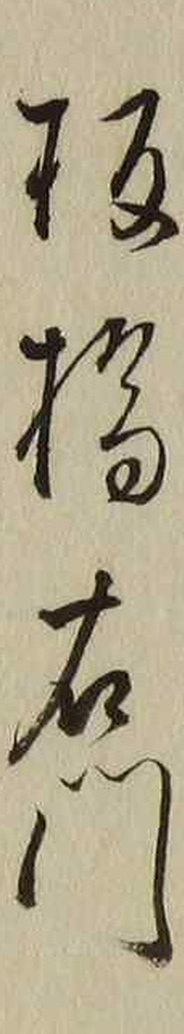板橋右門

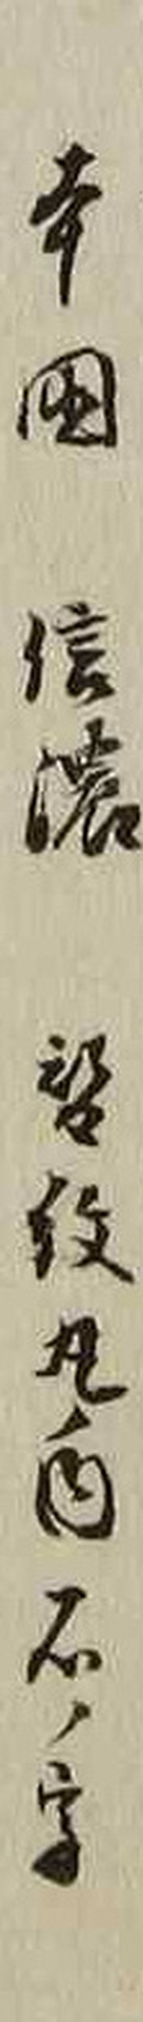本国信濃替紋丸之内石ノ字
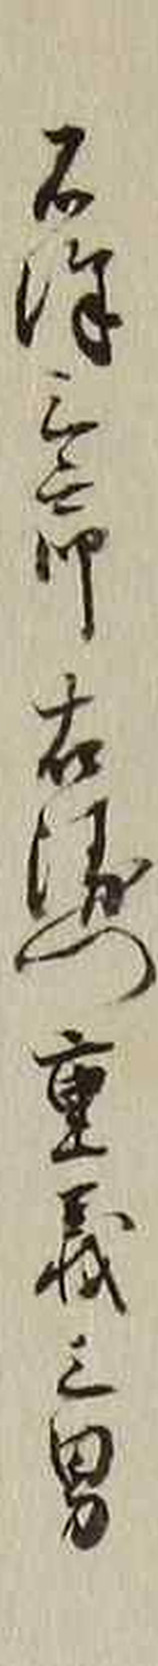石津三郎右衛門重義三男
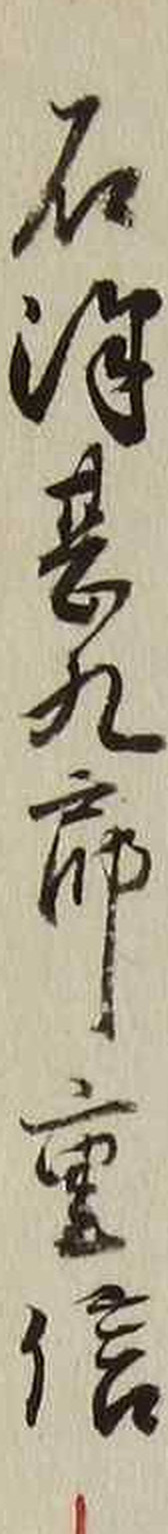石澤甚九郎重信
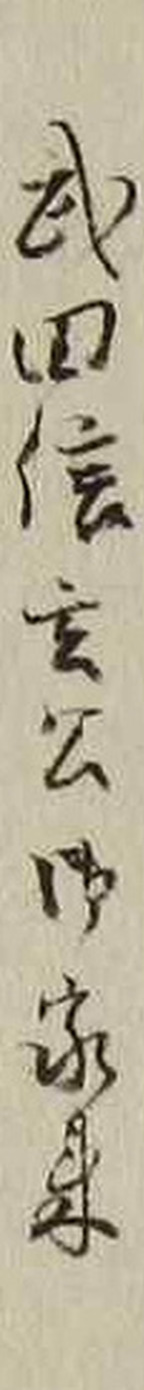武田信玄公御家来
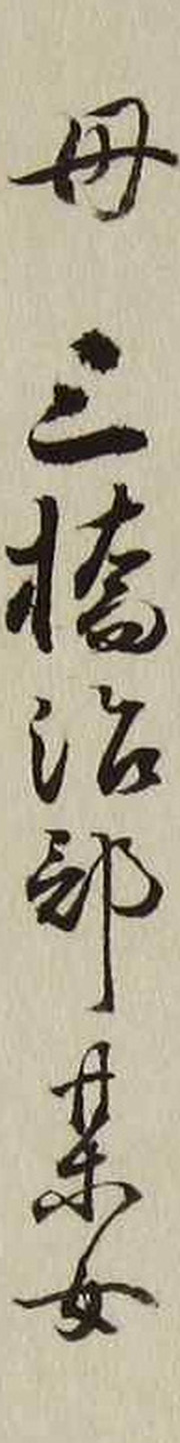母三橋治部某女
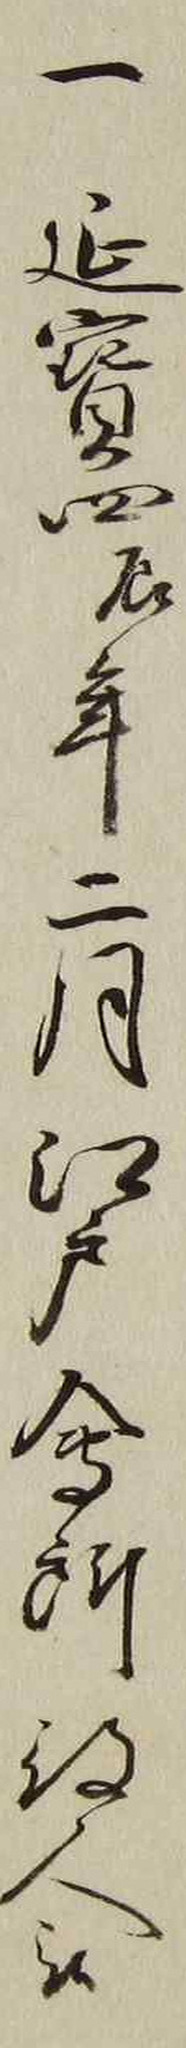一延宝四辰年二月江戸会所役人被
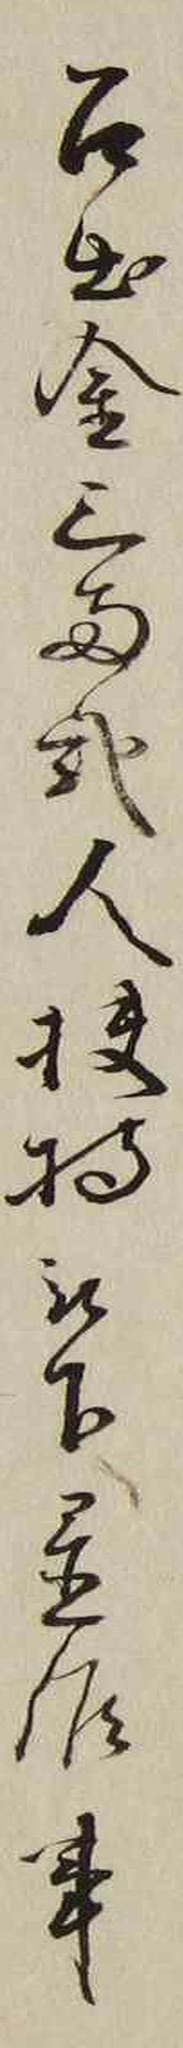召出金三両弐人扶持被下置候事
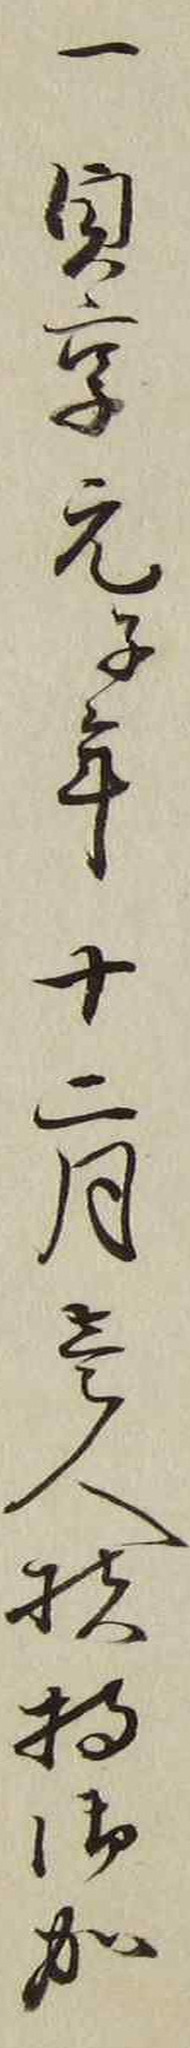一貞享元子年十二月壱人扶持御加

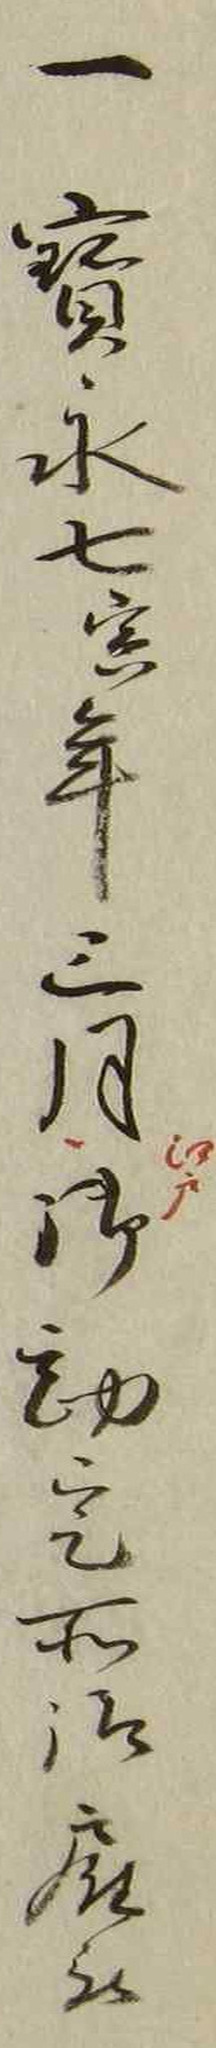一宝永七寅年三月・御勘定所御雇被
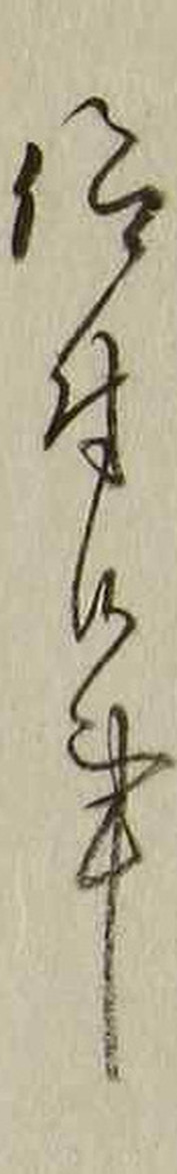仰付候事
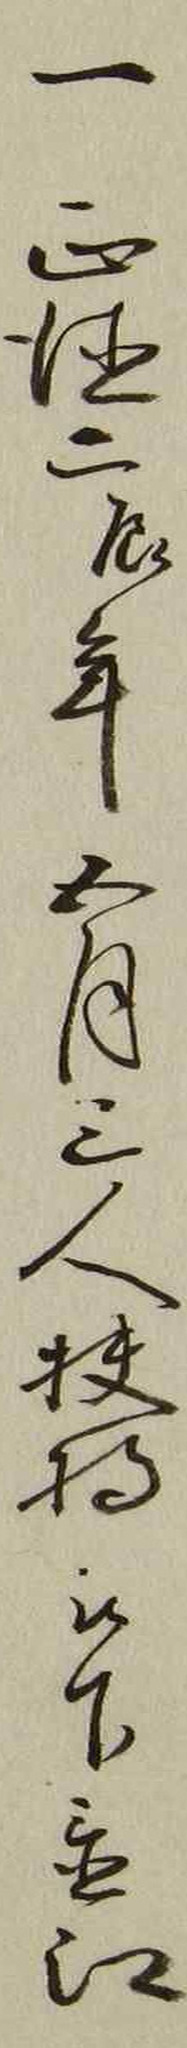一正徳二辰年五月三人扶持被下置江
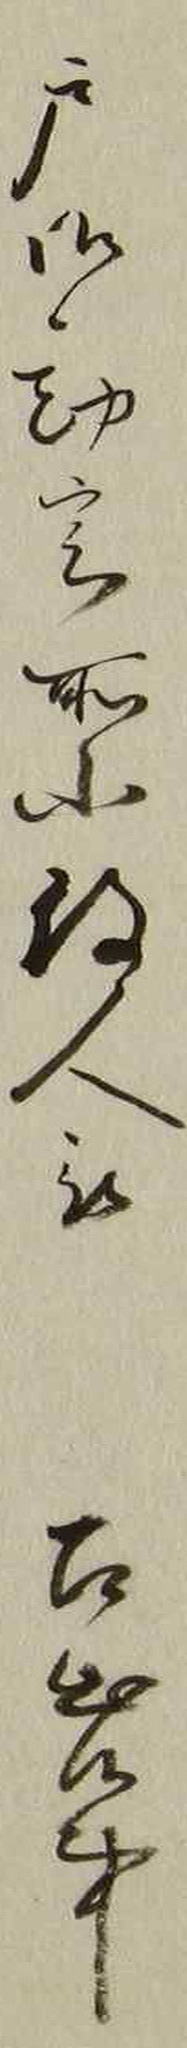戸御勘定所小役人被召出候事
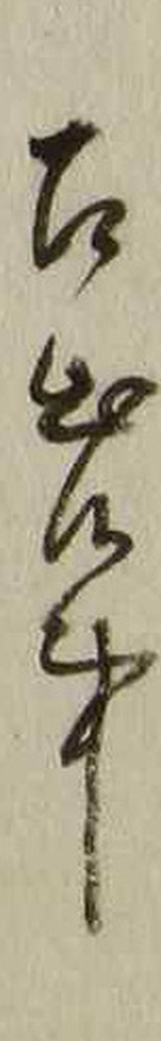仰出候事
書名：諸士系譜　巻之4　い之部4
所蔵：会津若松市立会津図書館
